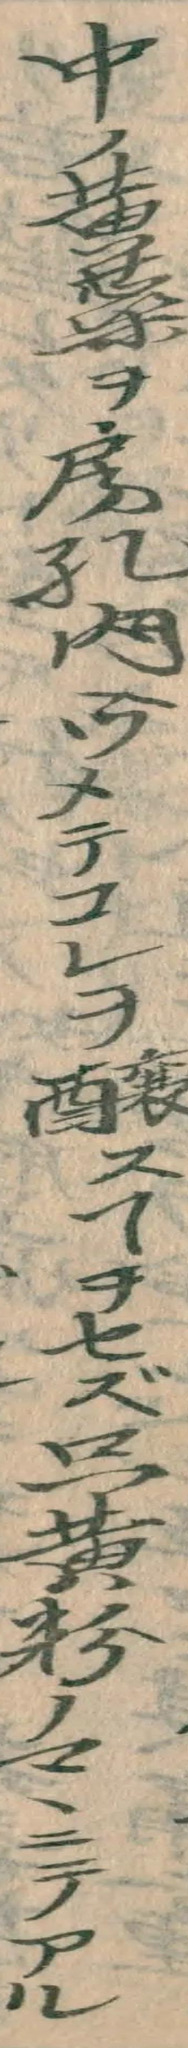中ノ黄蘂ヲ房孔内ヘツメテコレヲ醸スコトヲセズ只黄粉ノマヽニテアル
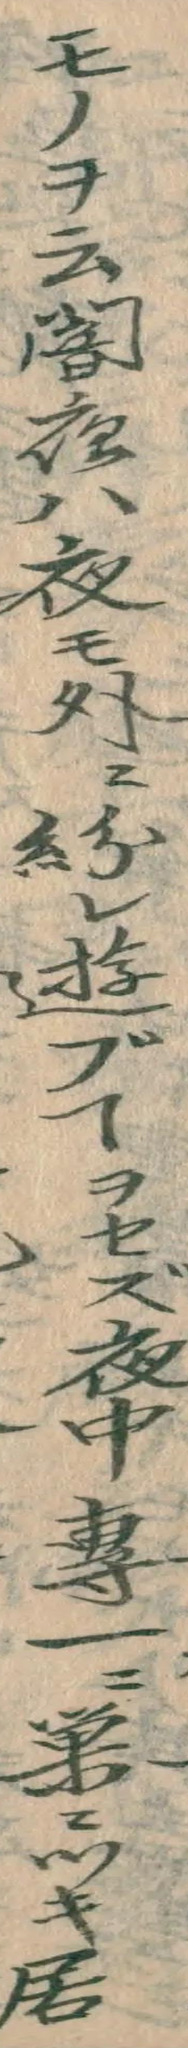モノヲ云闇夜ハ夜モ外ニ紛レ遊ブコトヲセズ夜中専一ニ巣ニツキ居
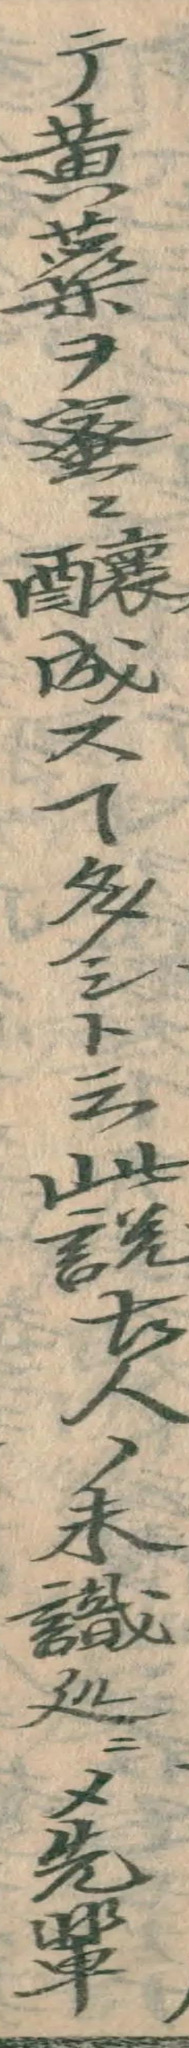テ黄蘂ヲ蜜ニ醸成スコト多シト云此説古人ノ未識処ニシテ先輩
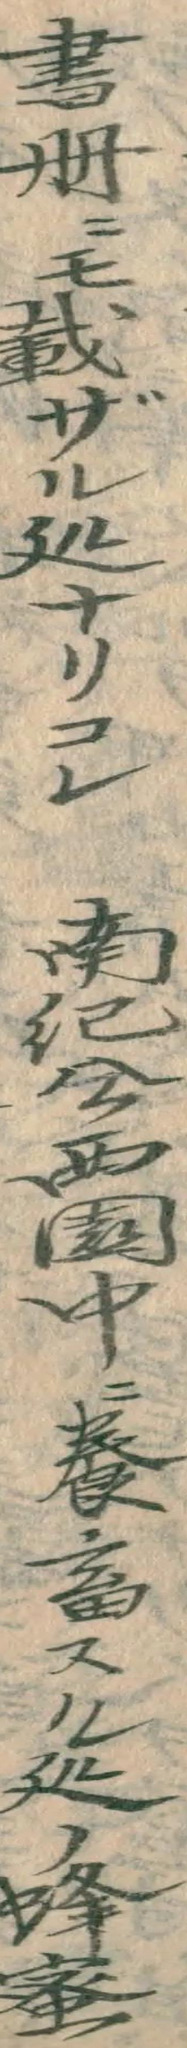書冊ニモ載ザル処ナリコレ南紀公西園中ニ養畜スル処ノ蜂蜜
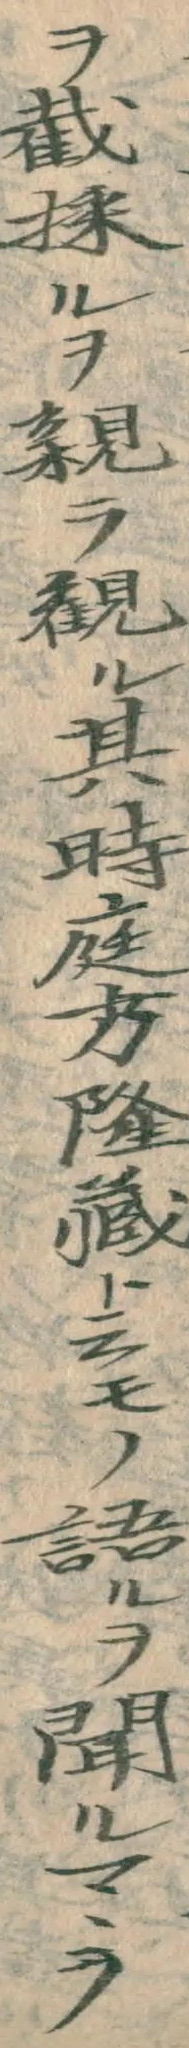ヲ截採ルヲ親ラ観ル其時庭方隆藏ト云モノ語ルヲ聞ルマヽヲ
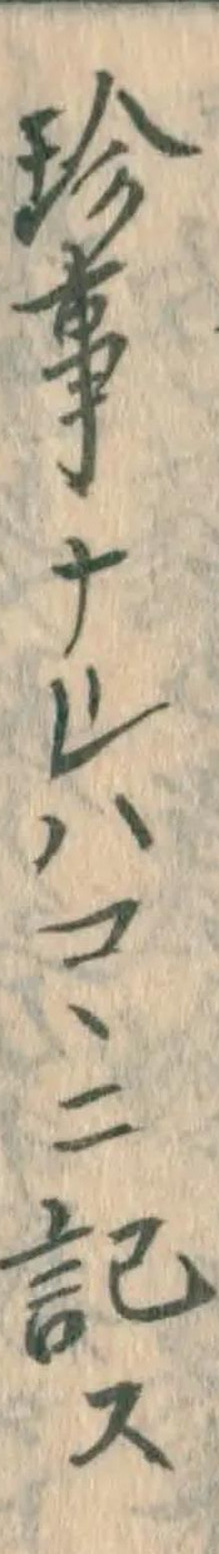珍事ナレハコヽニ記ス
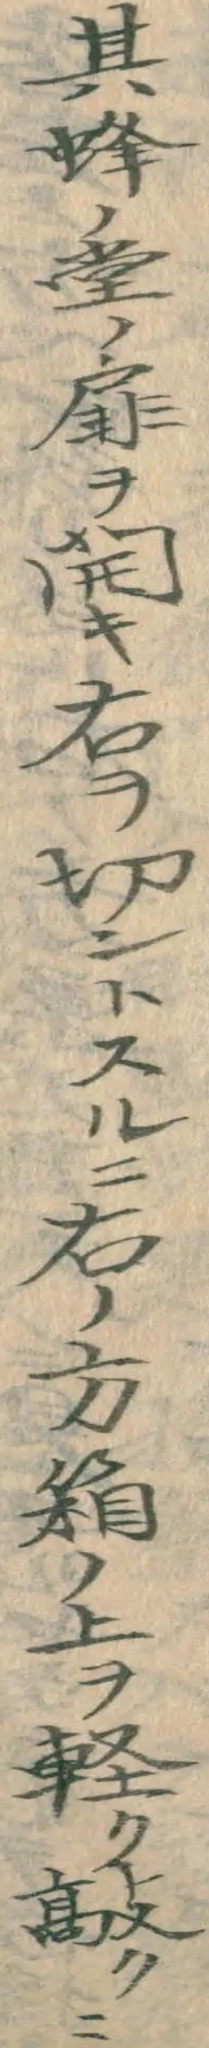其蜂ノ堂ノ扉ヲ開キ右ヲ切ントスルニ右ノ方箱ノ上ヲ軽ク敲クニ

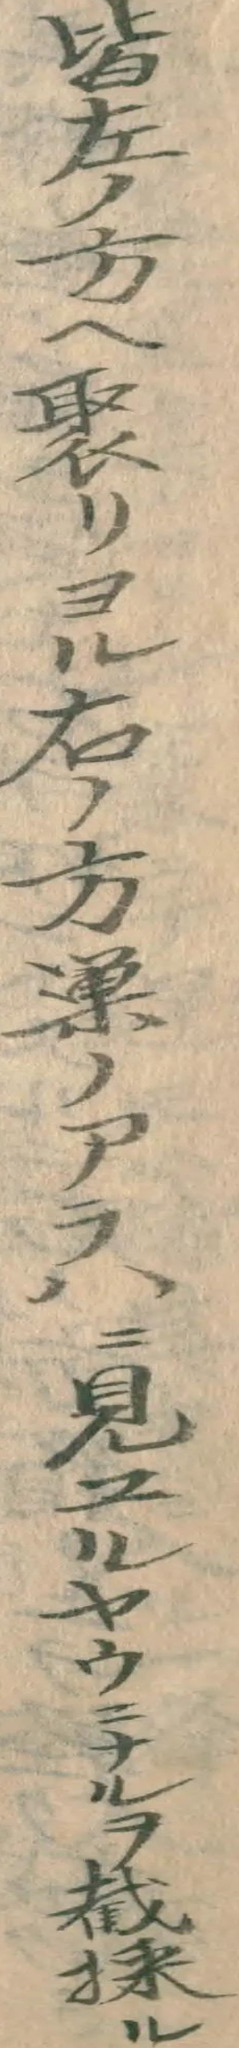皆左ノ方ヘ聚リヨル右ノ方巣ノアラハニ見ユルヤウニナルヲ截採ル
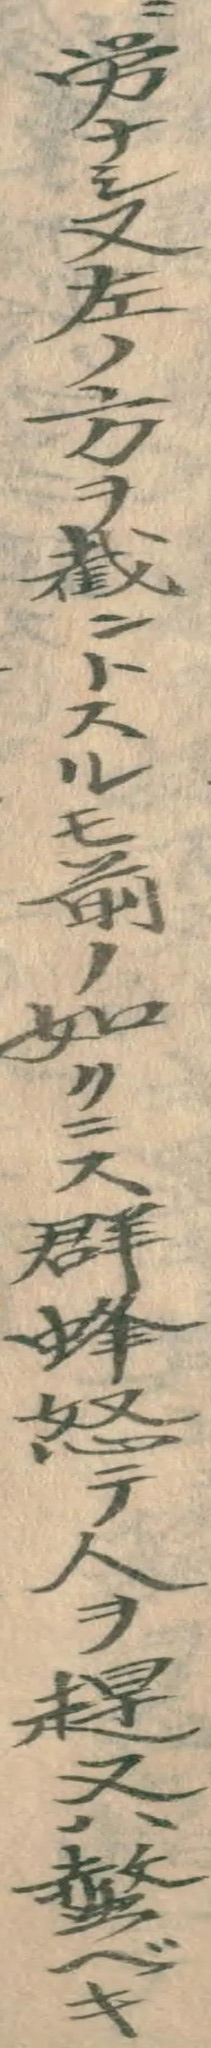ニ労ナシ又左ノ方ヲ截ントスルモ前ノ如クニス群蜂怒テ人ヲ趕又ハ螫ベキ
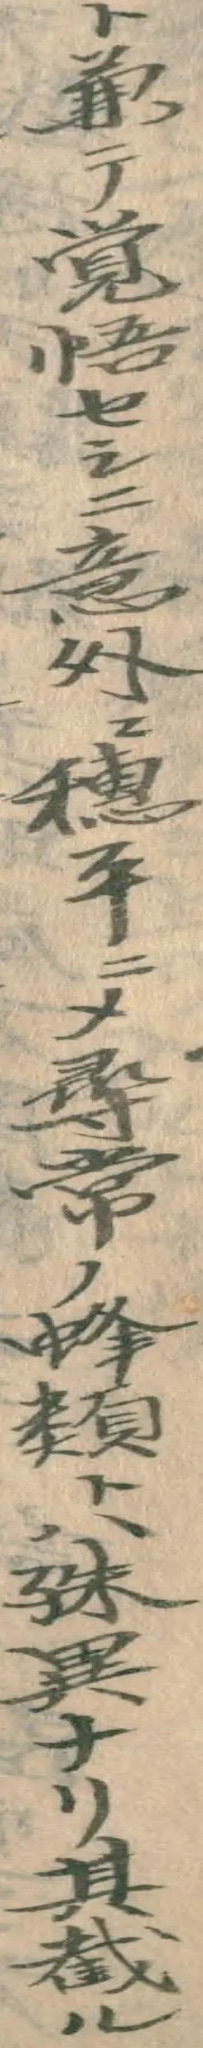ト兼テ覚悟セシニ意外ニ穂平ニシテ尋常ノ蜂類トハ殊異ナリ其截ル
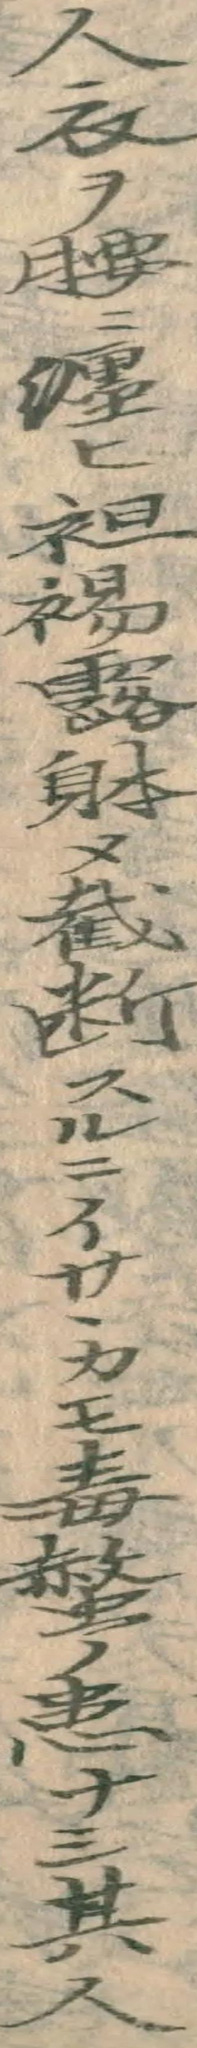人衣ヲ腰ニ纒ヒ袒裼露躰シテ截断スルニイサヽカモ毒螫ノ患ナシ其人
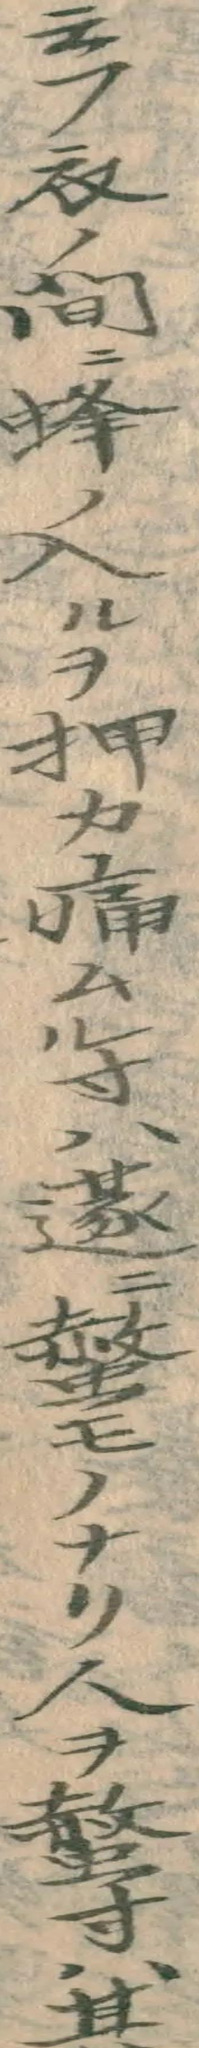云フ衣ノ間ニ蜂ノ入ルヲ押カ痛ムル時ハ遂ニ螫モノナリ人ヲ螫時ハ其
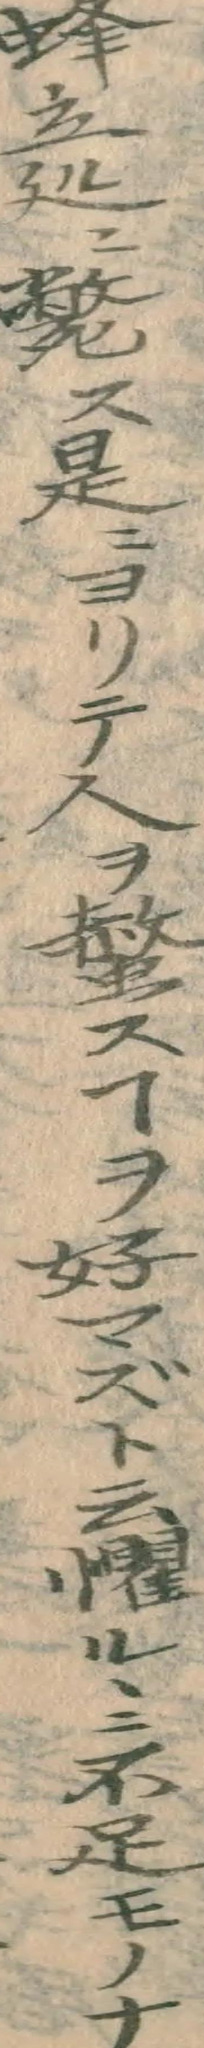蜂立処ニ斃ス是ニヨリテ人ヲ螫スコトヲ好マズト云懼ルヽニ不足モノナ
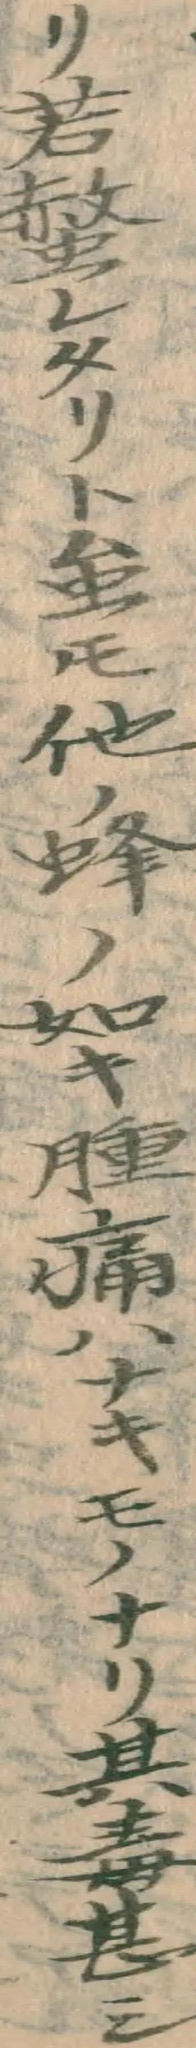リ若螫レタリト雖トモ他ノ蜂ノ如キ腫痛ハナキモノナリ其毒甚シ
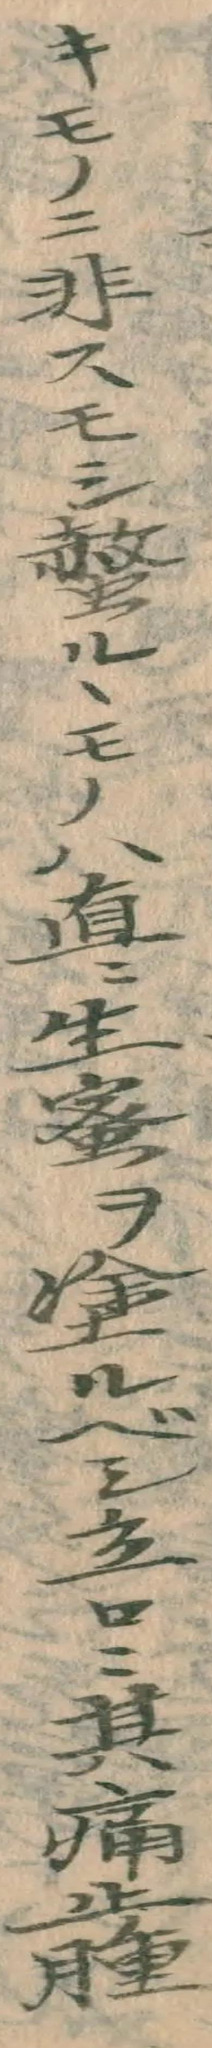キモノニ非スモシ螫ルヽモノハ直ニ生蜜ヲ塗ルベシ立ロニ其痛止腫
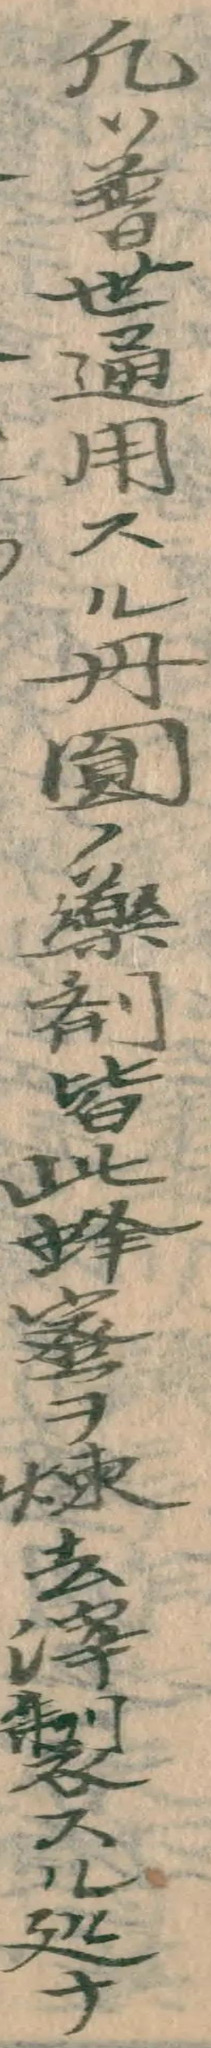凡ソ普世通用スル丹圓ノ薬剤皆此蜂蜜ヲ煉去瀉製スル処ナ
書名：千蟲譜 3巻. [1]
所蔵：国立国会図書館 National Diet Library, JAPAN
